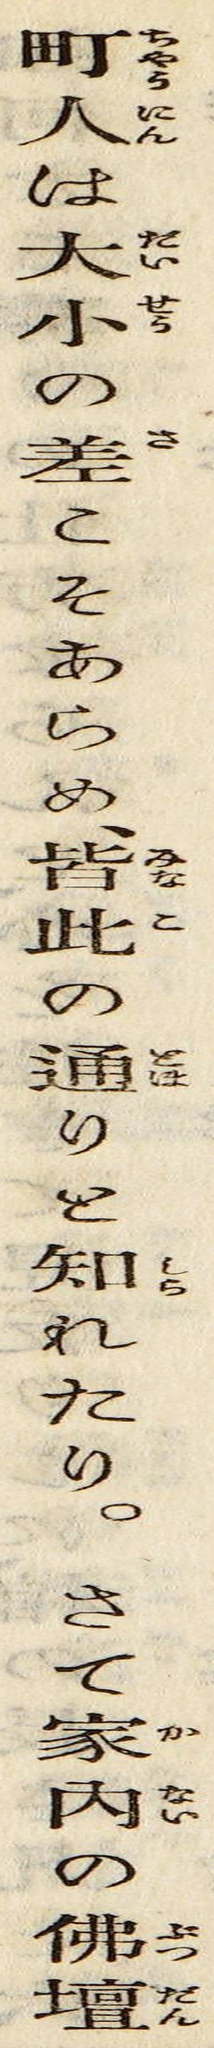町人は大小の差こそあらめ、皆此の通りと知れたり。さて家内の仏壇
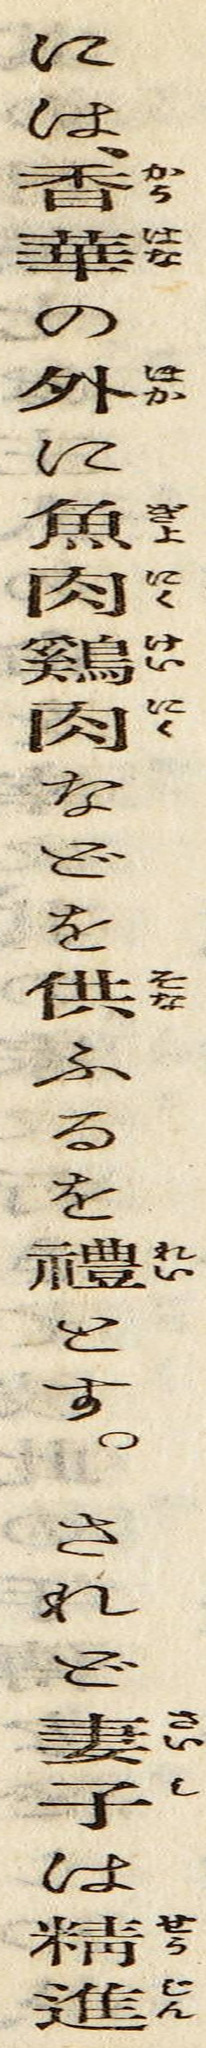には、香華の外に魚肉鶏肉などを供ふるを礼とす。されど妻子は精進
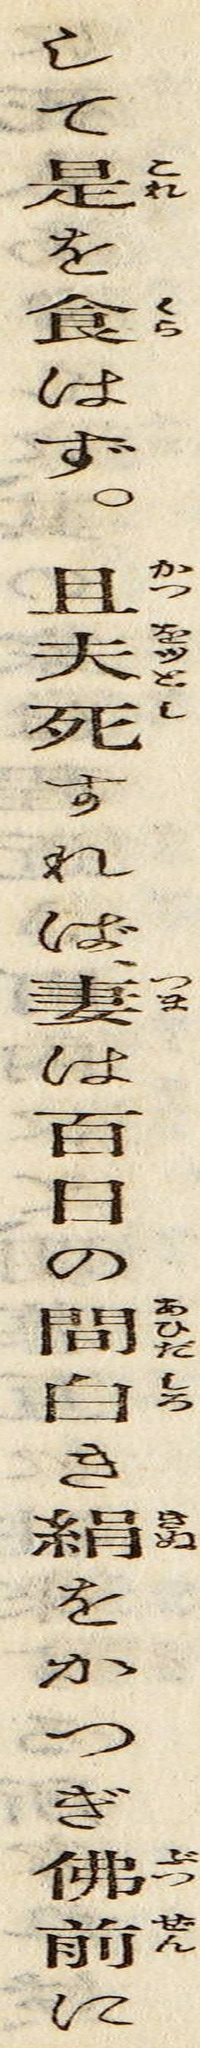して是を食はず。且夫死すれば、妻は百日の間白き絹をかつぎ仏前に
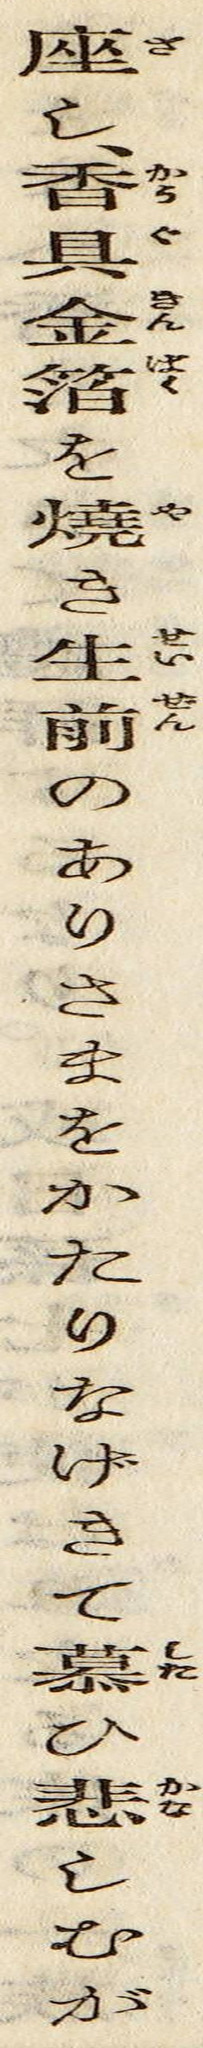座し、香具金箔を焼き生前のありさまをかたりなげきて慕ひ悲しむが
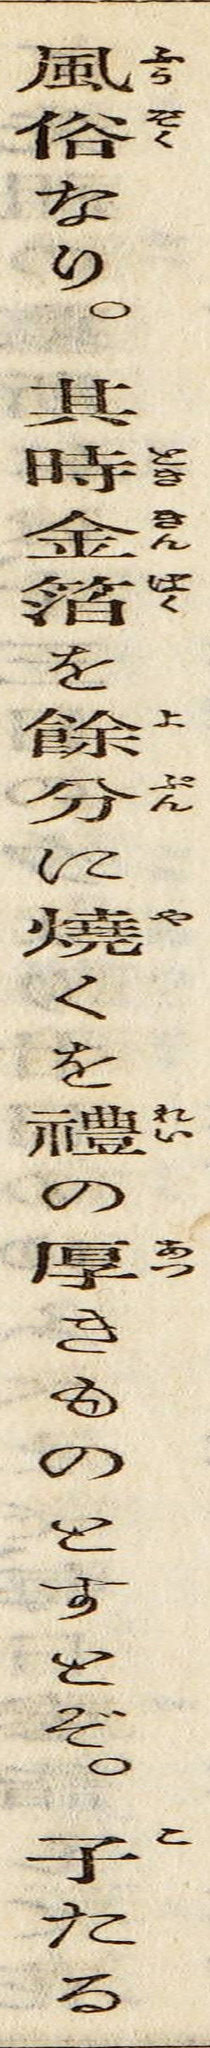風俗なり。其時金箔を余分に焼くを礼の厚きものとすとぞ。子たる
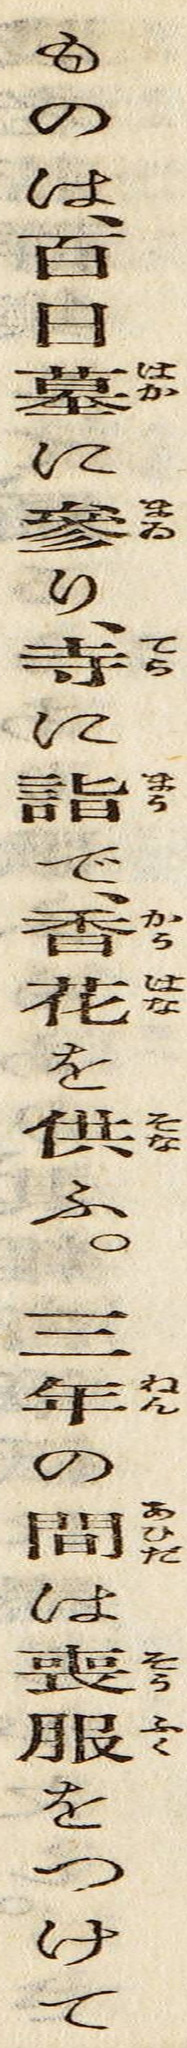ものは、百日墓に参り、寺に詣で、香花を供ふ。三年の間は喪服をつけて
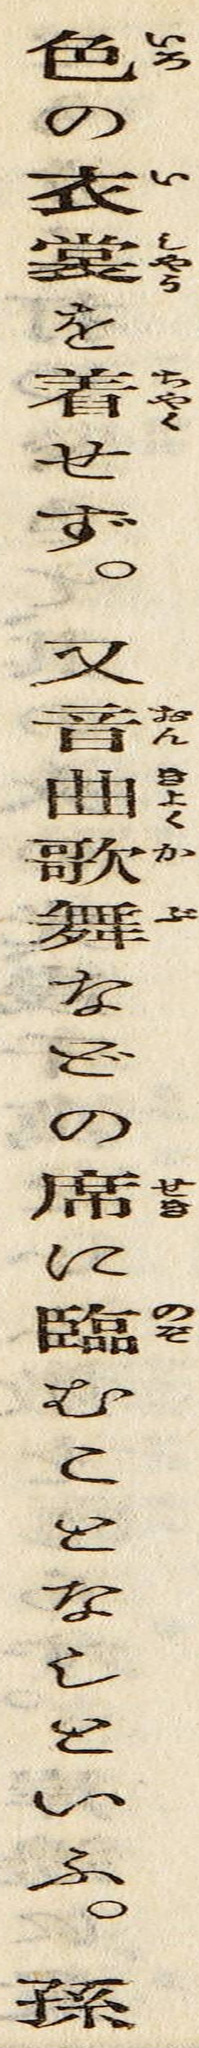色の衣裳を着せず。又音曲歌舞などの席に臨むことなしといふ。孫
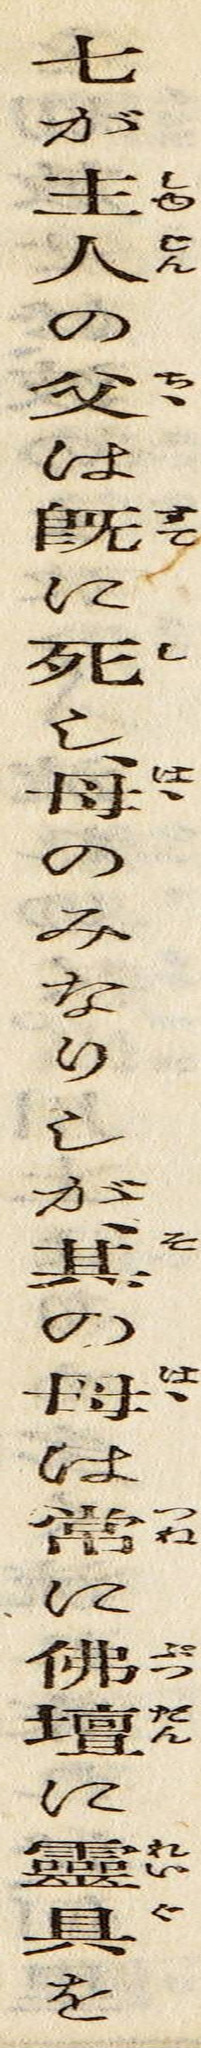七が主人の父は既に死し、母のみなりしが、其の母は常に仏壇に霊具を
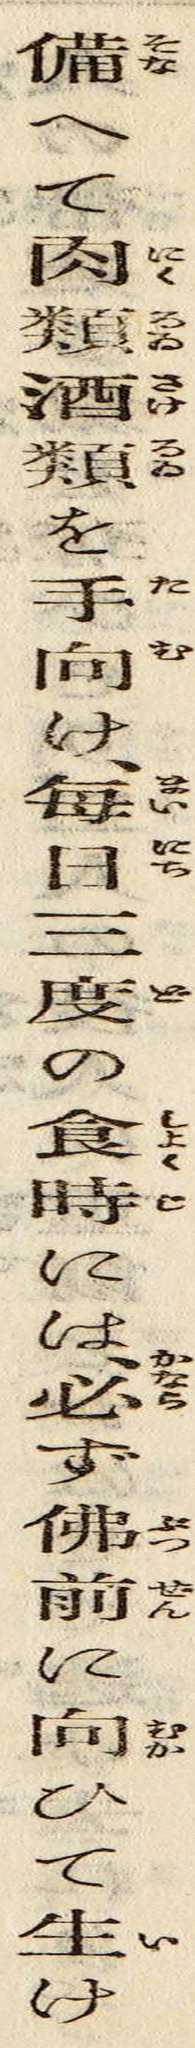備へて肉類酒類を手向け、毎日三度の食時には、必ず仏前に向ひて生け
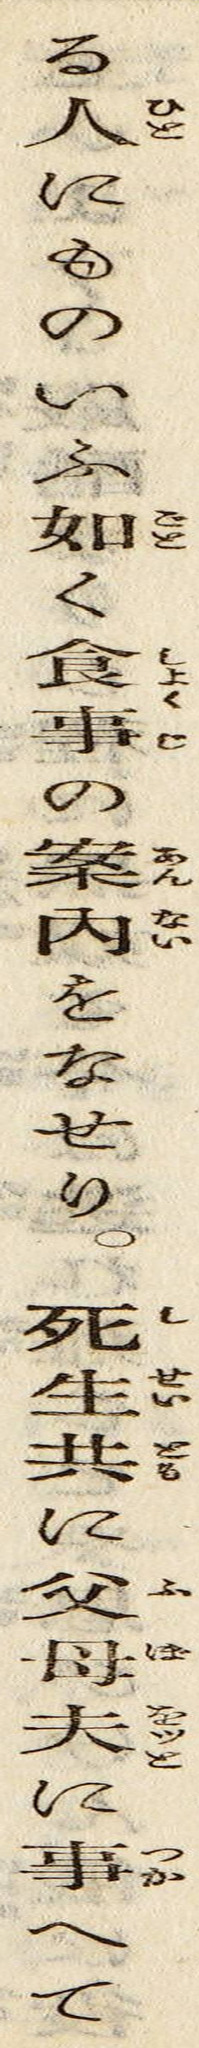る人にものいふ如く食事の案内をなせり。死生共に父母夫に事へて
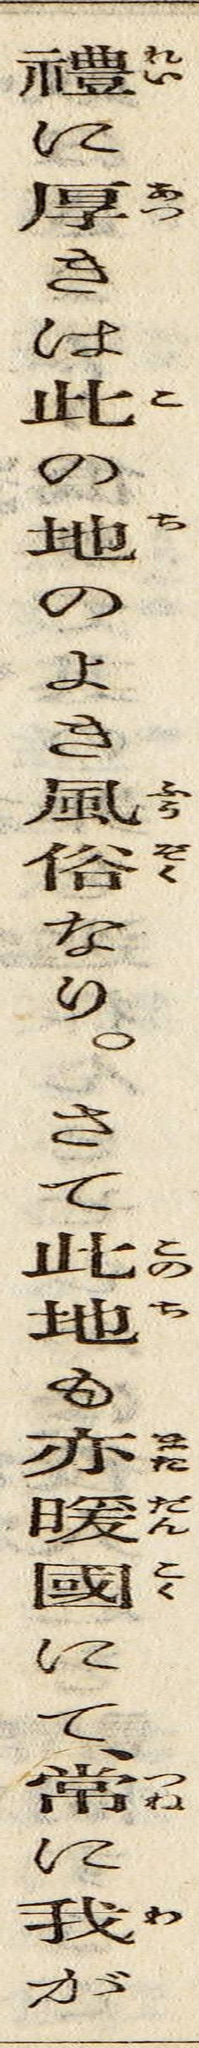礼に厚きは此の地のよき風俗なり。さて此地も亦暖国にて、常に我が
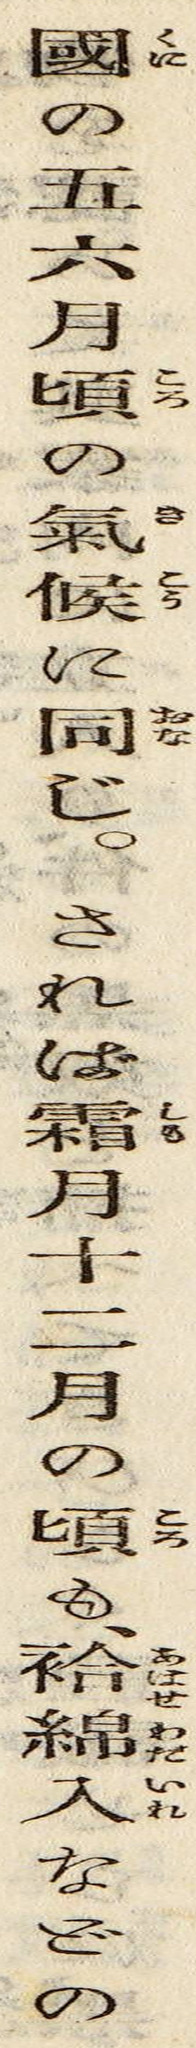国の五六月頃の気候に同じ。されば霜月十二月の頃も、袷綿入などの
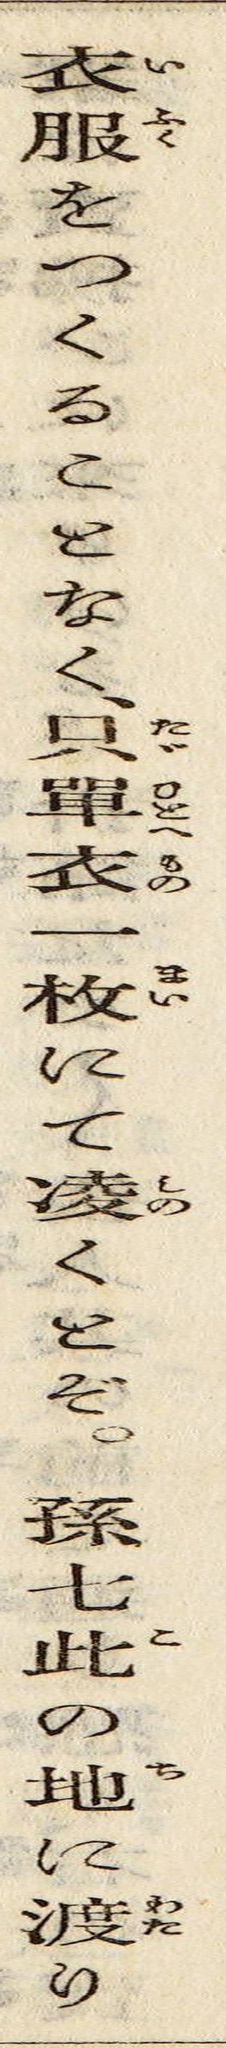衣服をつくることなく、只単衣一枚にて凌くとぞ。孫七此の地に渡り
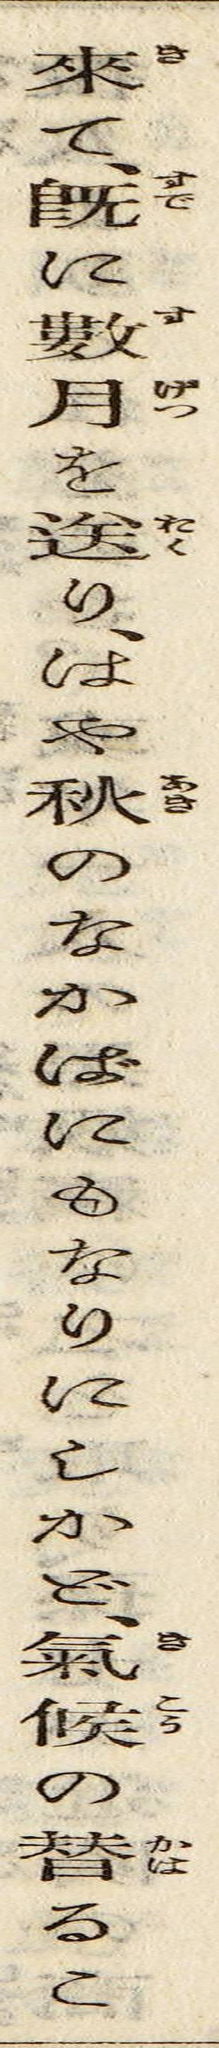来て、既に数月を送り、はや秋のなかばにもなりしかど、気候の替るこ
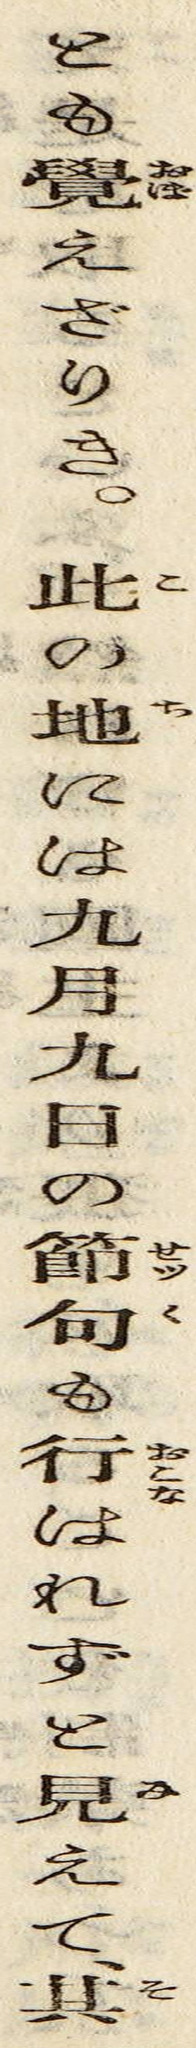とも覚えざりき。此の地には九月九日の節句も行はれずと見えて、其
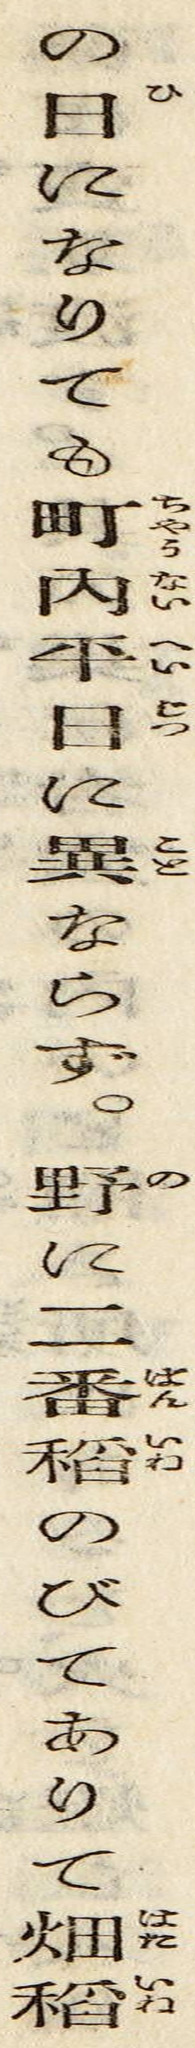の日になりても町内平日に異ならず。野に二番稲のびてありて畑稲
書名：日本漂流譚
